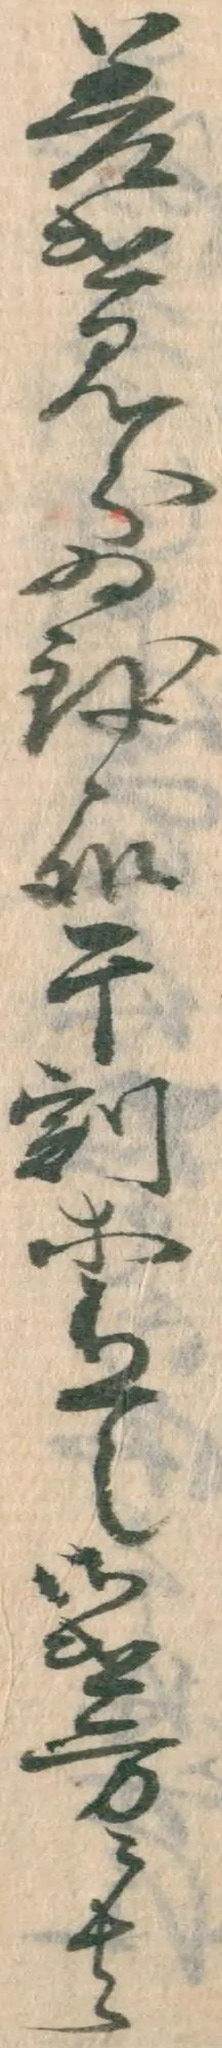差遣見分為致候処干割等有之御遣方ニは

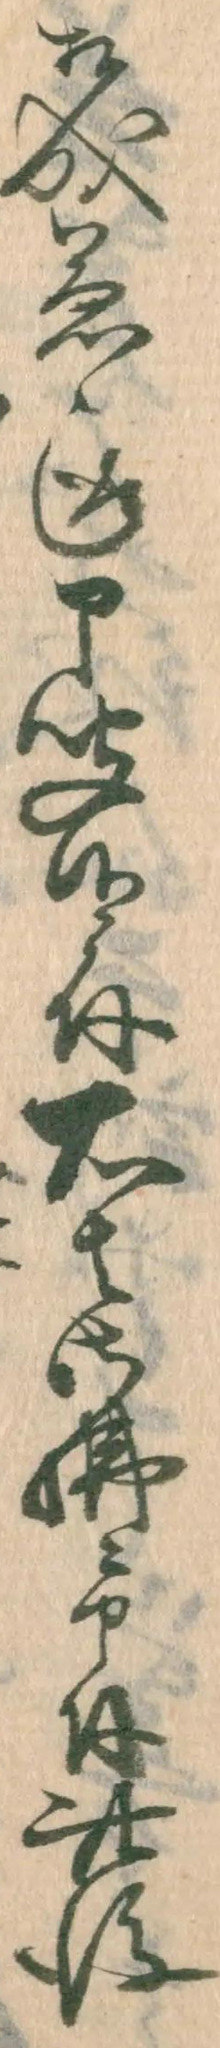相成兼候趣申聞候ニ付右は御払ニ申付此後
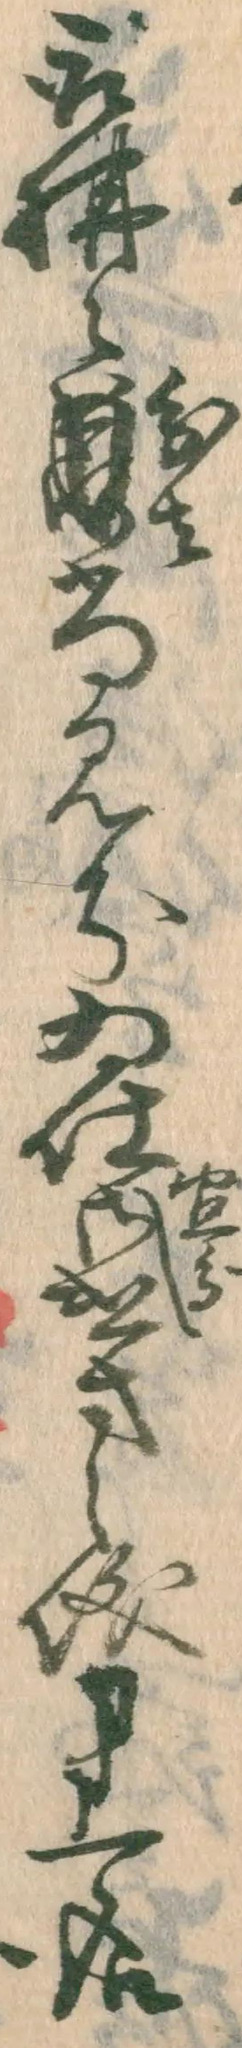取払之分は尚見分為仕宜分御遣方之儀申上候様
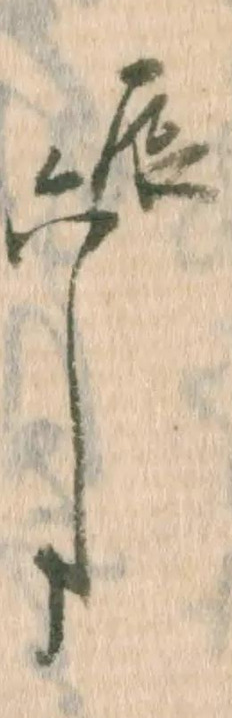辰六月
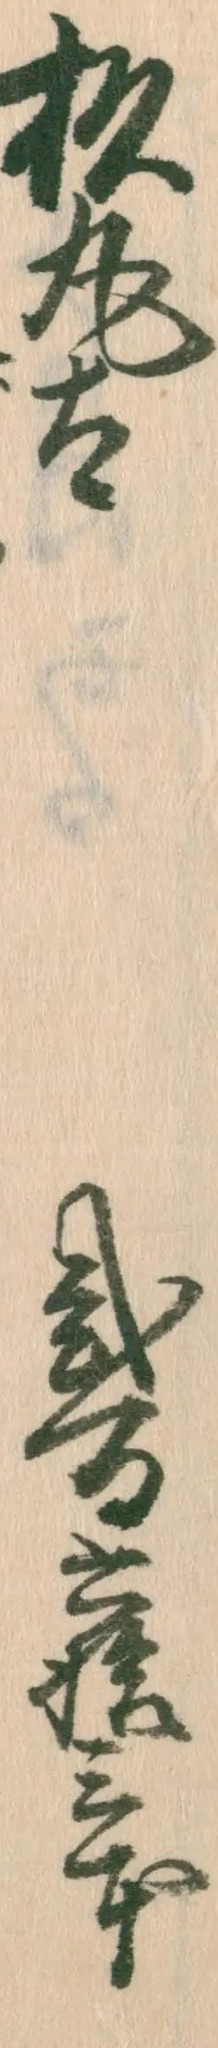一杉丸太弐百六拾三本
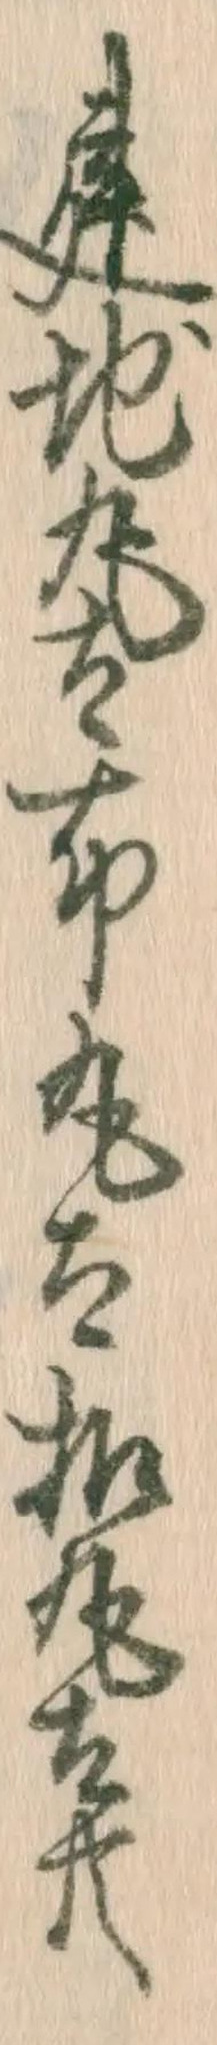建地丸太布丸太扣丸太共
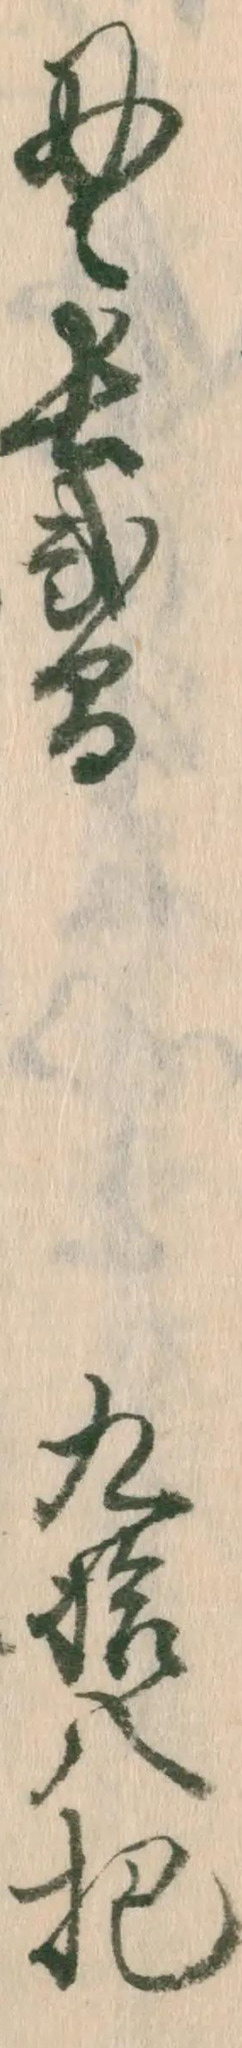一貫長弐間九拾八把
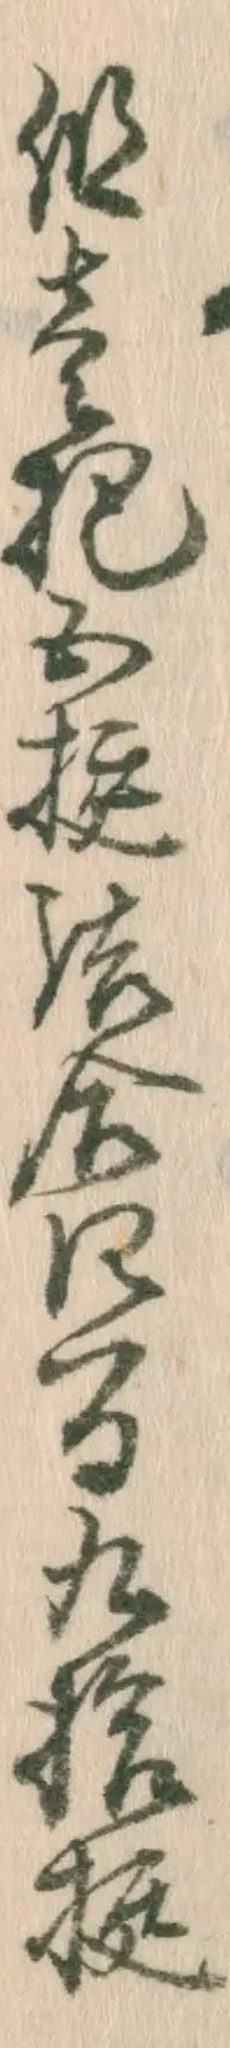但壱把五挺詰合四百九拾挺
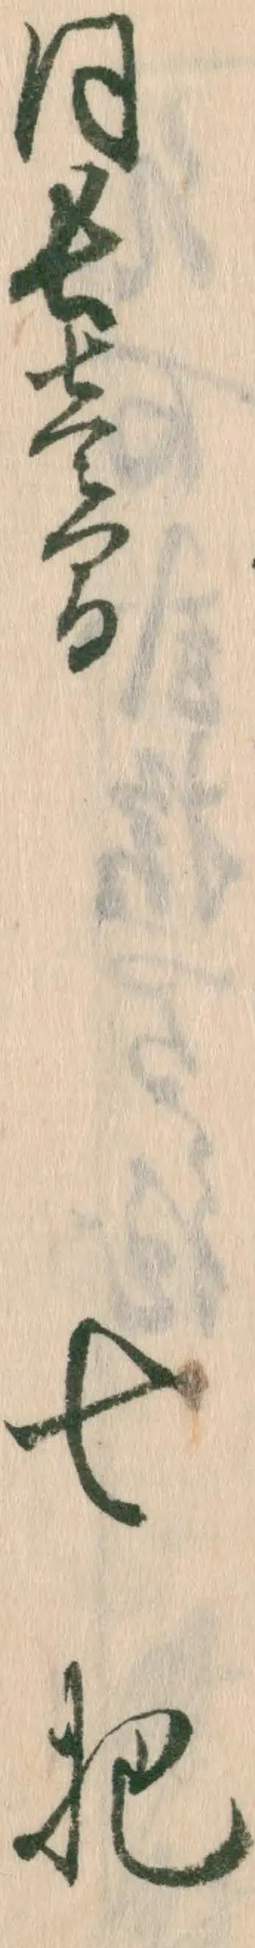一同長壱間七把
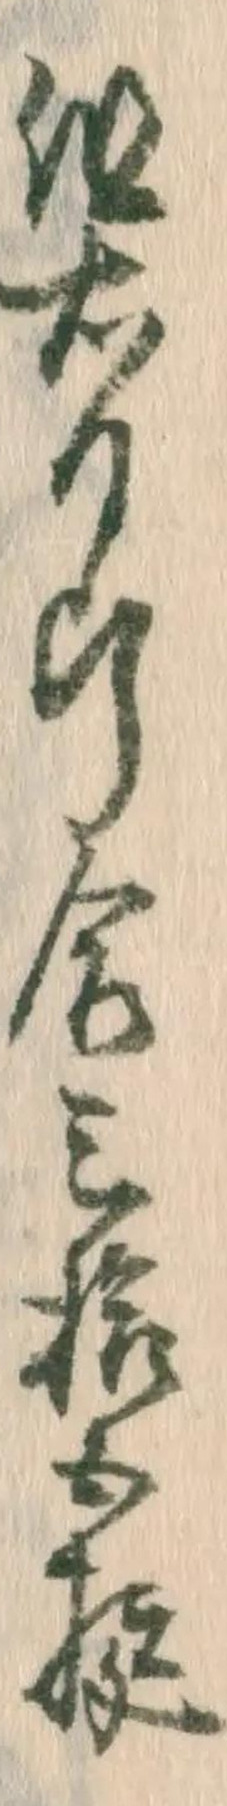但右同断合三拾五挺
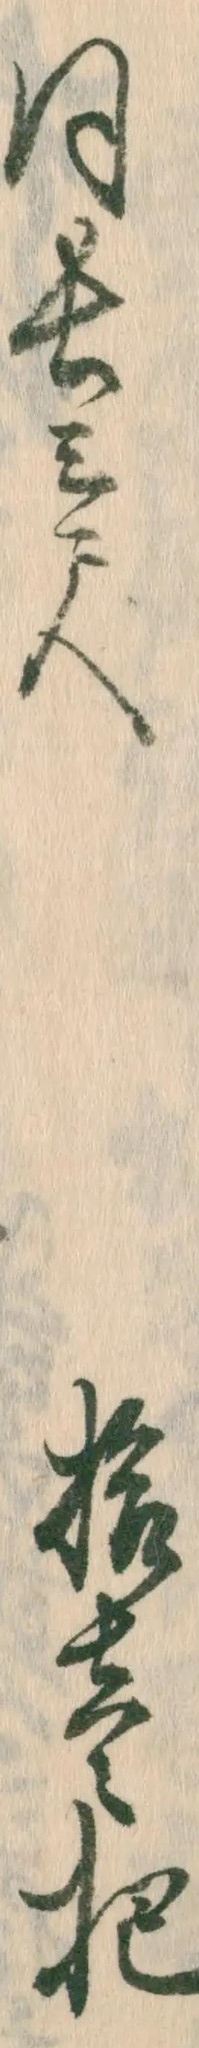一同長三尺拾壱把
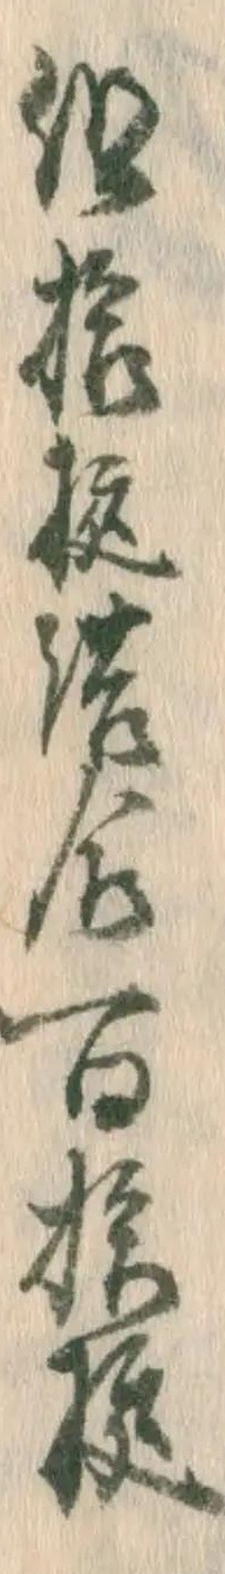但拾挺詰合百拾挺

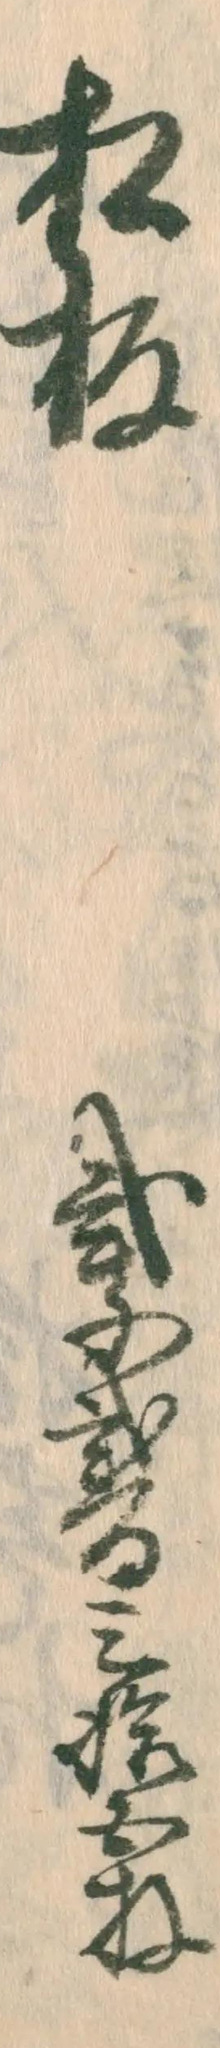一松板弐千弐百三拾五枚
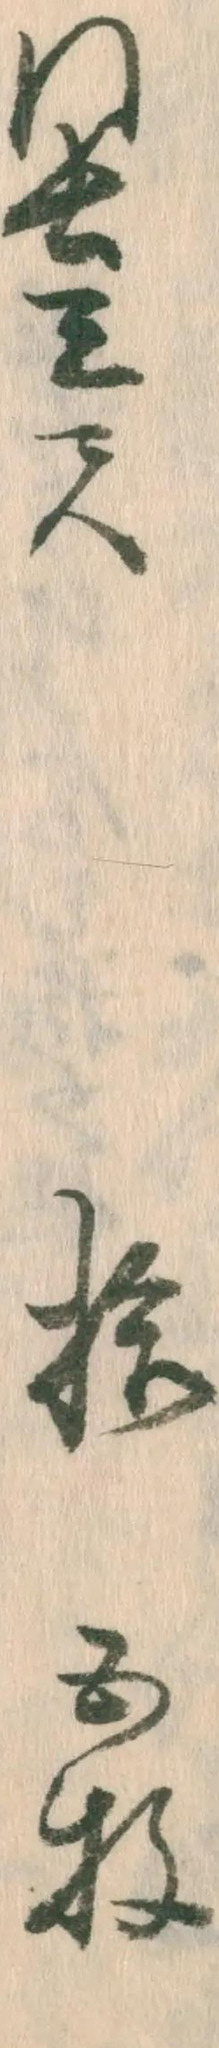一同長三尺拾五枚
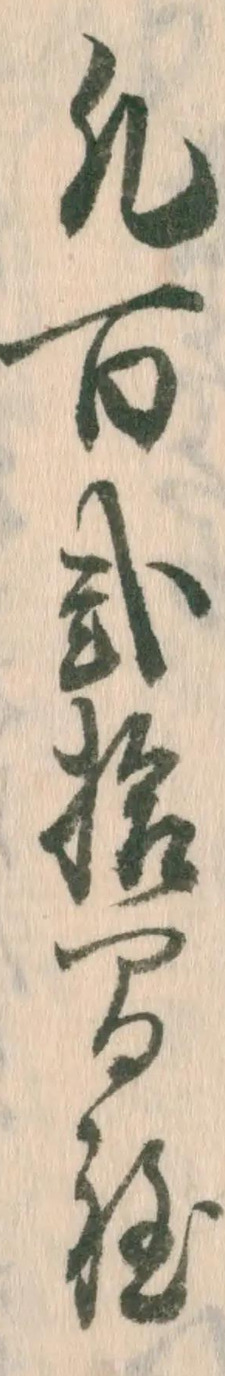凡百弐拾間程
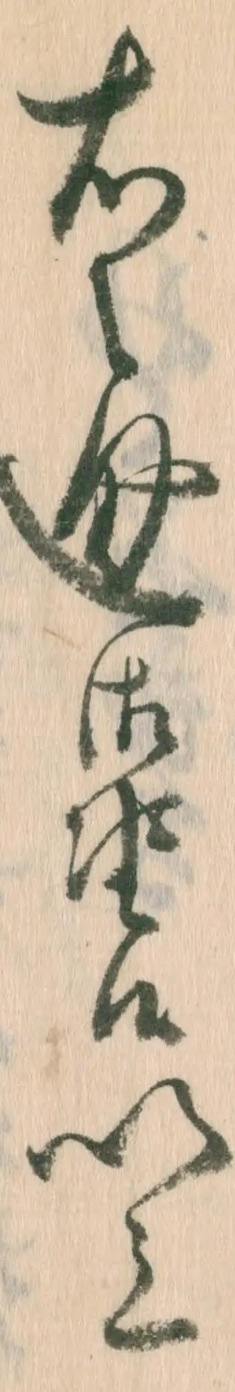右之通御座候以上
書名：七十冊物類集 71巻. [44] 四十三 牢屋敷御普請御修覆地震ニ付骨折候牢屋掛御褒美之部
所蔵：国立国会図書館 National Diet Library, JAPAN
